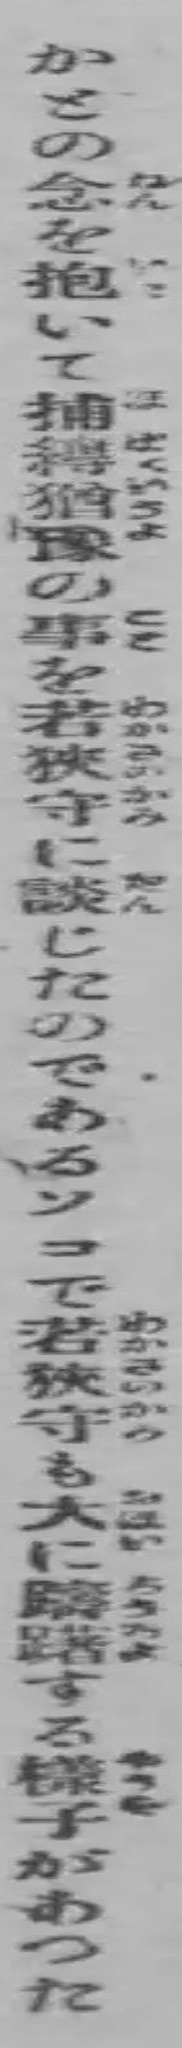かとの念を抱いて捕縛猶予の事を若狭守に談じたのであるソコで若狭守も大に躊躇する様子があつた
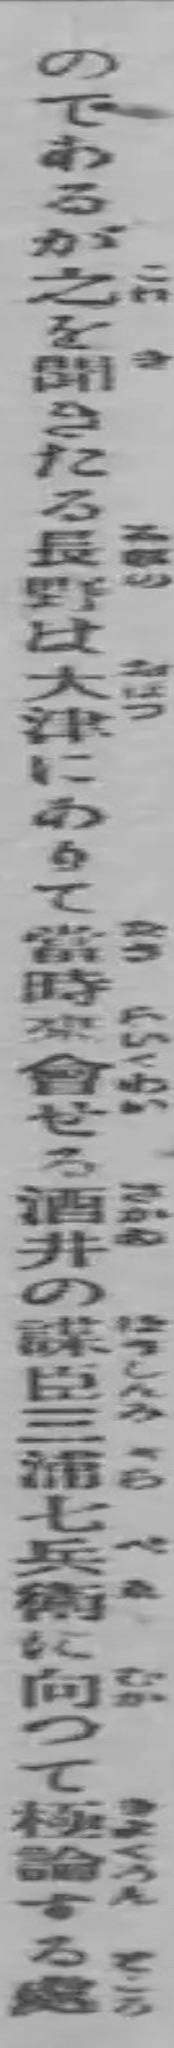のであるが之を聞きたる長野は大津にありて当時来会せる酒井の謀臣三浦七兵衛に向つて極論する処
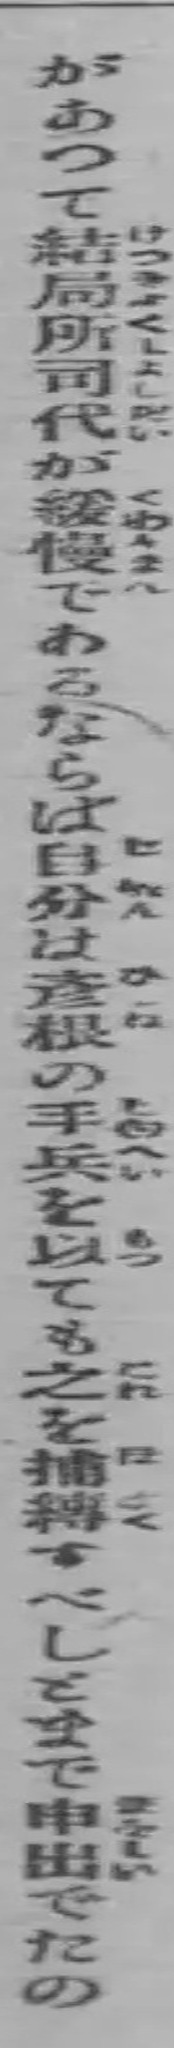があつて結局所司代が緩慢であるならば自分は彦根の手兵を以ても之を捕縛すべしとまで申出でたの

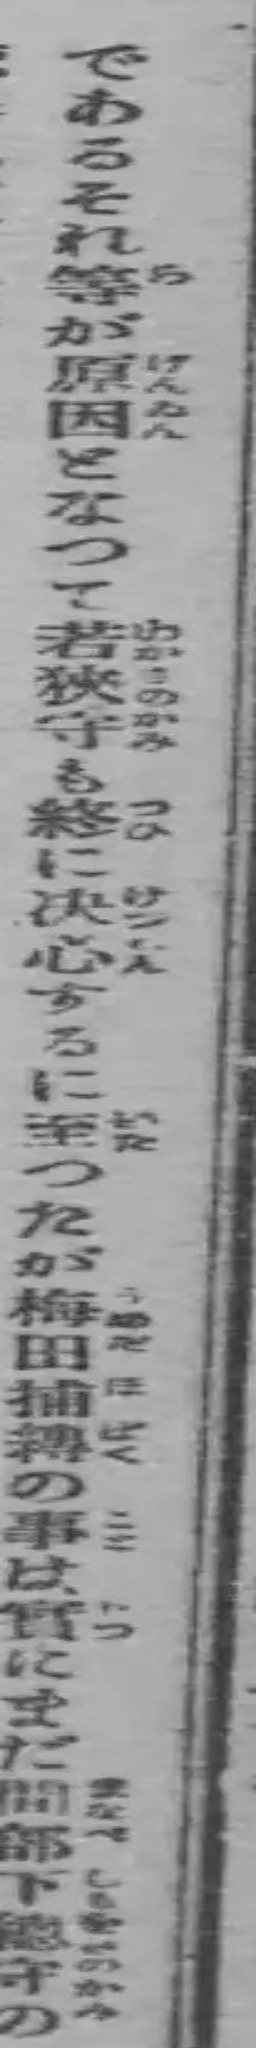であるそれ等が原因となつて若狭守も終に決心するに至つたが梅田捕縛の事は実にまだ間部下総守の
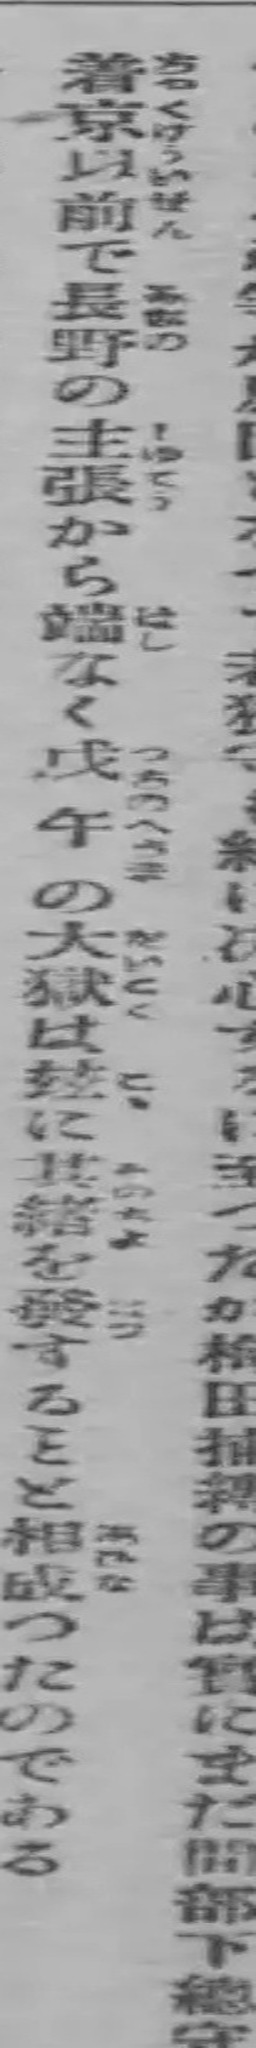着京以前で長野の主張から端なく戊午の大獄は茲に其緒を発することと相成つたのである
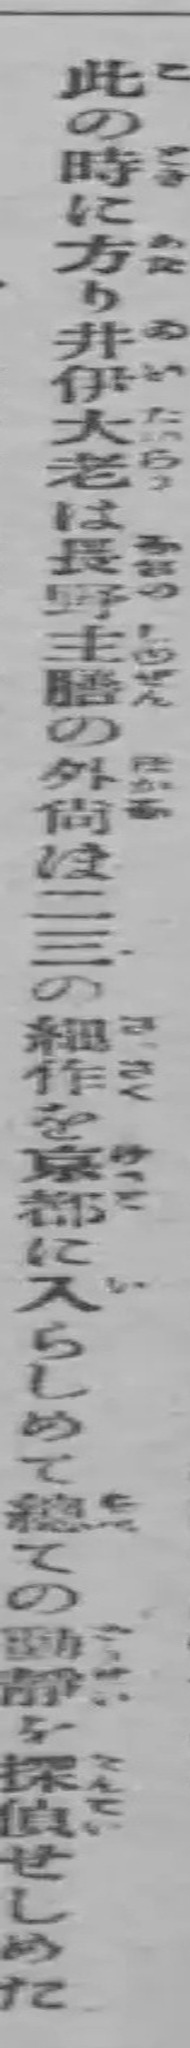此の時に方り井伊大老は長野主膳の外尚ほ二三の細作を京都に入らしめて総ての動静を探偵せしめた
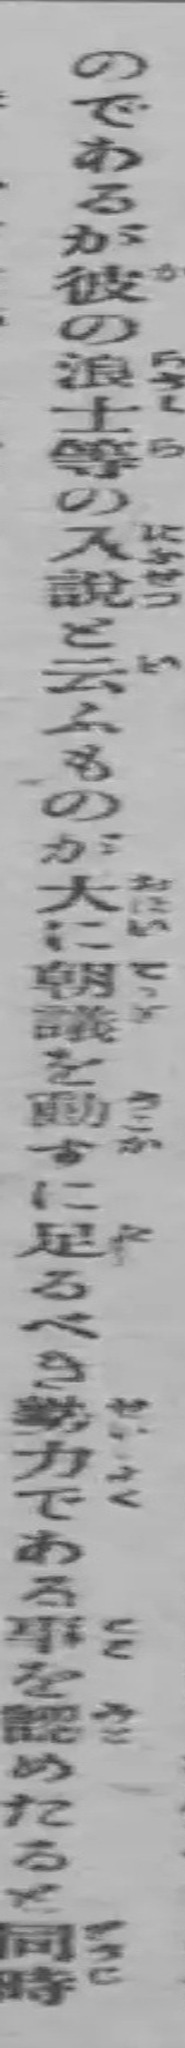のであるが彼の浪士等の入説と云ふものが大に朝議を動すに足るべき勢力である事を認めたると同時
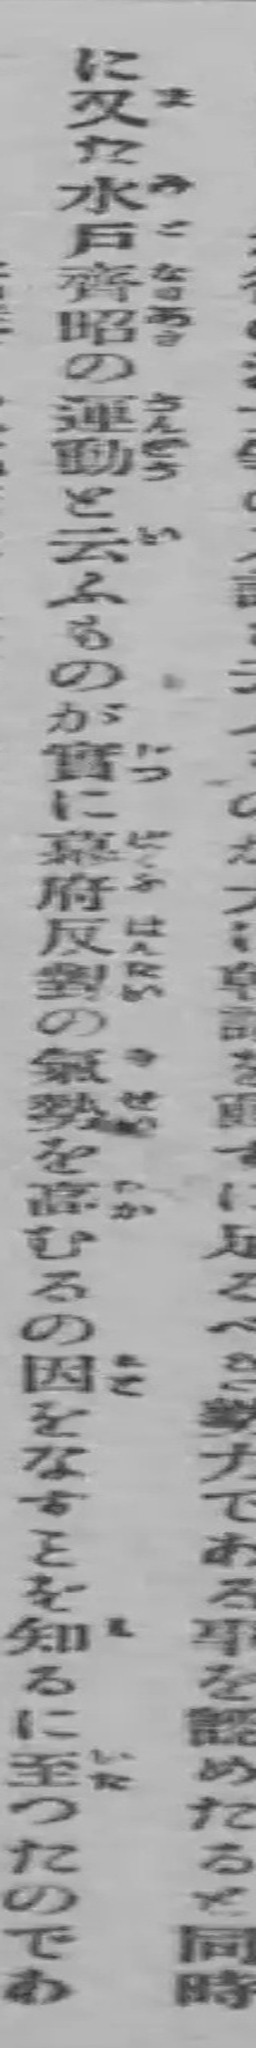に又た水戸斉昭の運動と云ふものが実に幕府反対の気勢を高むるの因をなすことを知るに至つたのであ
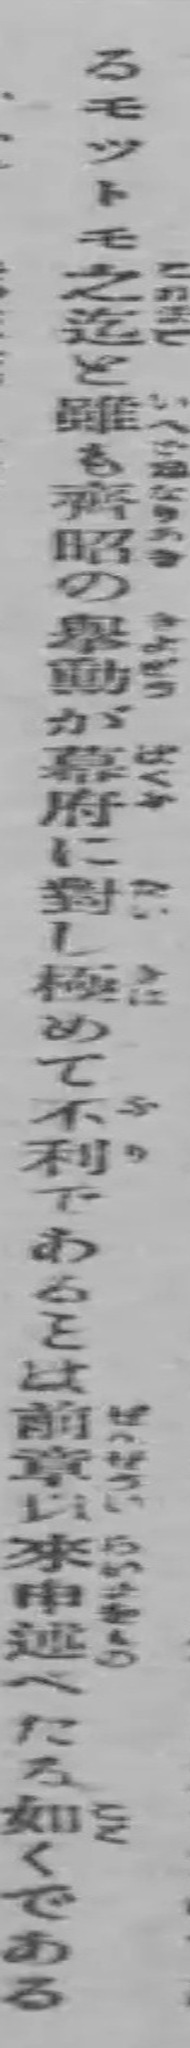るモツトモ之迄と雖も斉昭の挙動が幕府に対し極めて不利であることは前章以来申述べたる如くである
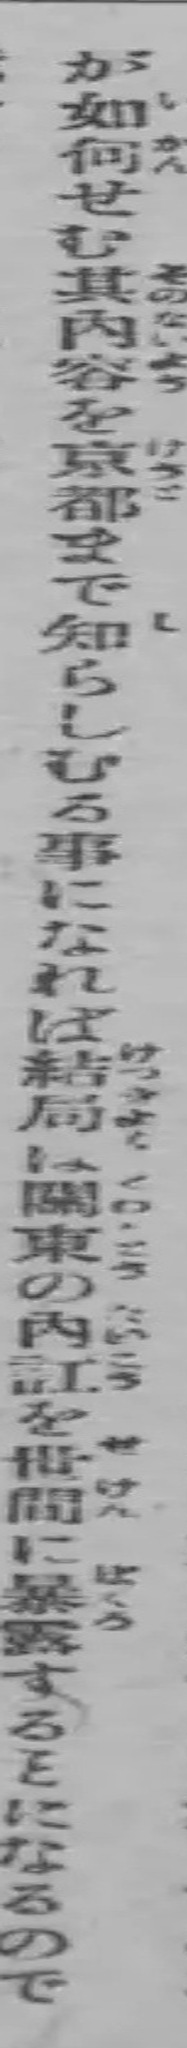が如何せむ其内容を京都まで知らしむる事になれば結局は関東の内訌を世間に暴露することになるので
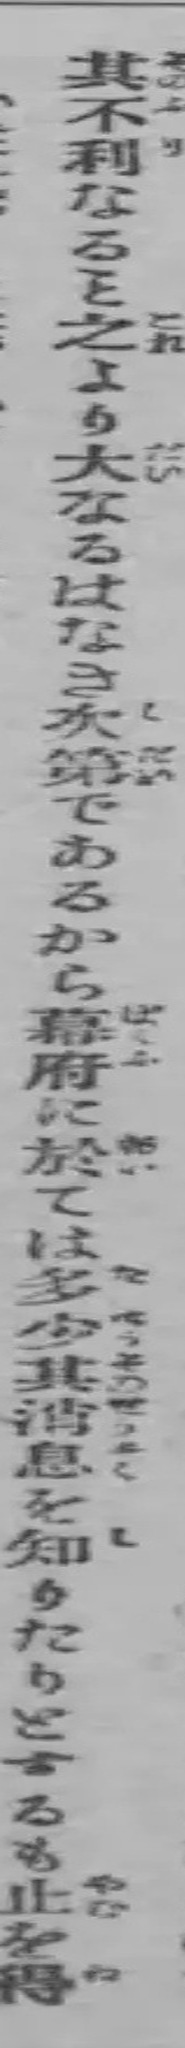其不利なること之より大なるはなき次第であるから幕府に於ては多少其消息を知りたりとするも止を得
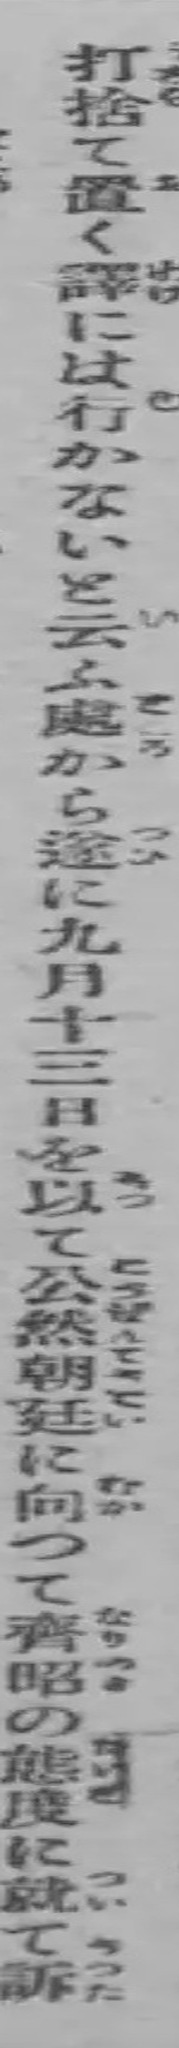打捨て置く訳には行かないと云ふ処から遂に九月十三日を以て公然朝廷に向つて斉昭の態度に就て訴
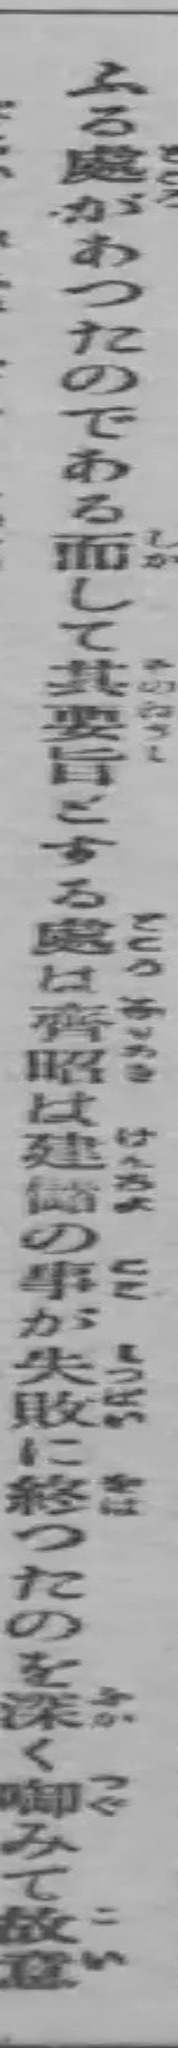ふる処があつたのである而して其要旨とする処は斉昭は建儲の事が失敗に終つたのを深く啣みて故意
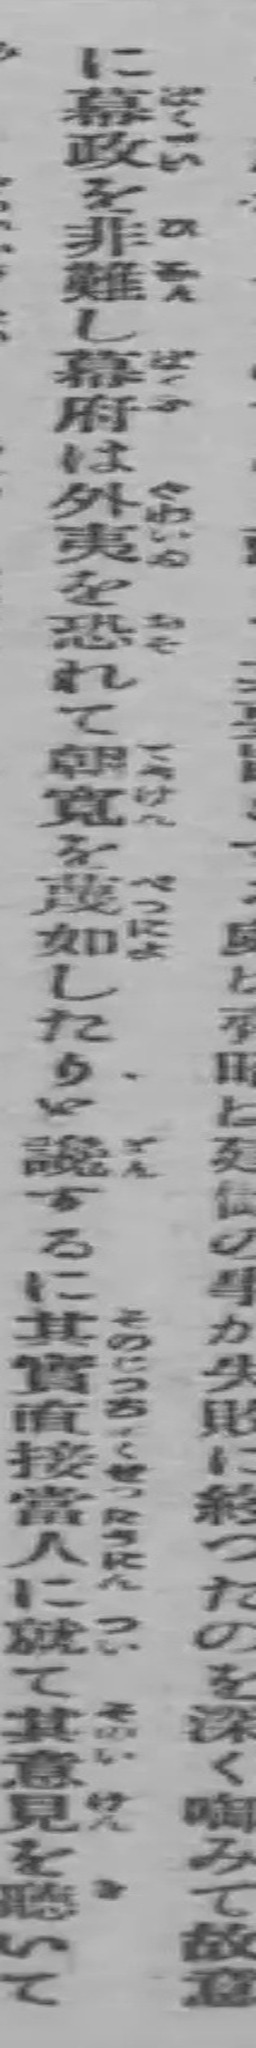に幕政を非難し幕府は外夷を恐れて朝寬を蔑如したりと讒するに其実直接当人に就て其意見を聴いて
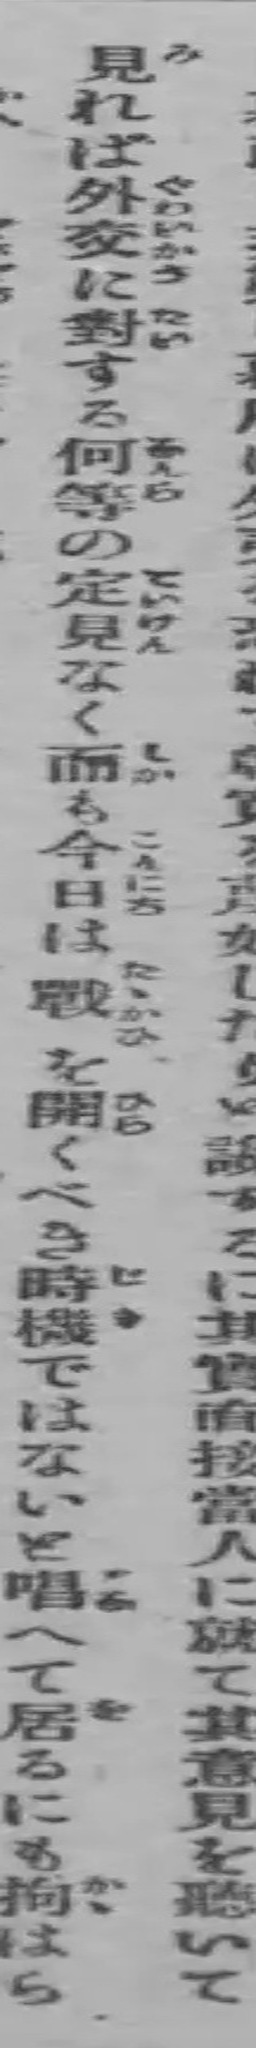見れば外交に対する何等の定見なく而も今日は戦を開くべき時機ではないと唱へて居るにも拘はら
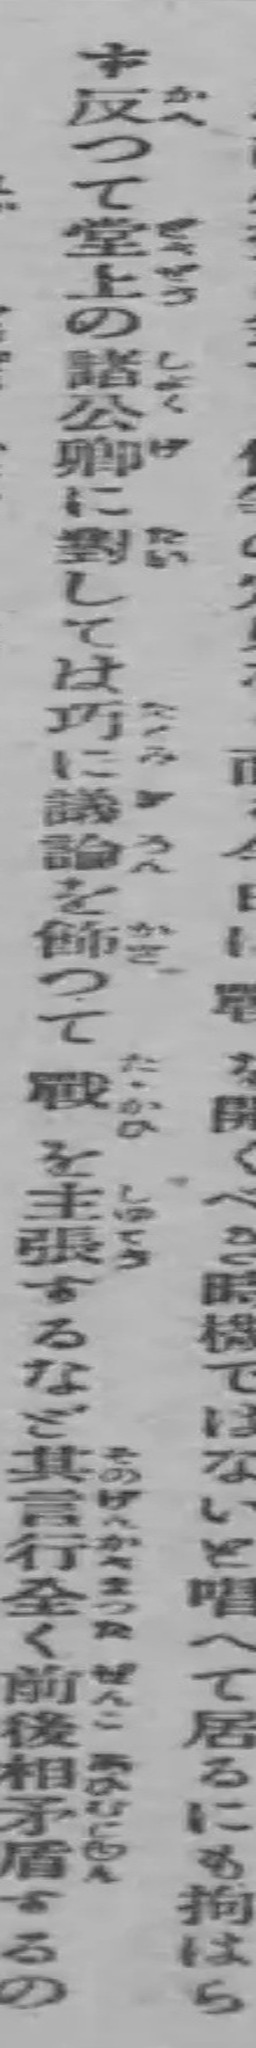ず反つて堂上の諸公卿に対しては巧に議論を飾つて戦を主張するなど其言行全く前後相矛盾するの
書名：豊橋市史談
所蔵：国立国会図書館 National Diet Library, JAPAN
